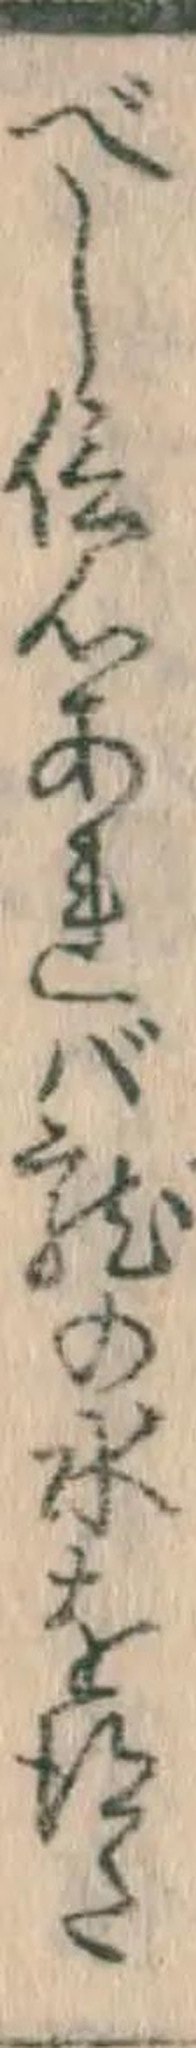べし信心あれば竜の水を得た
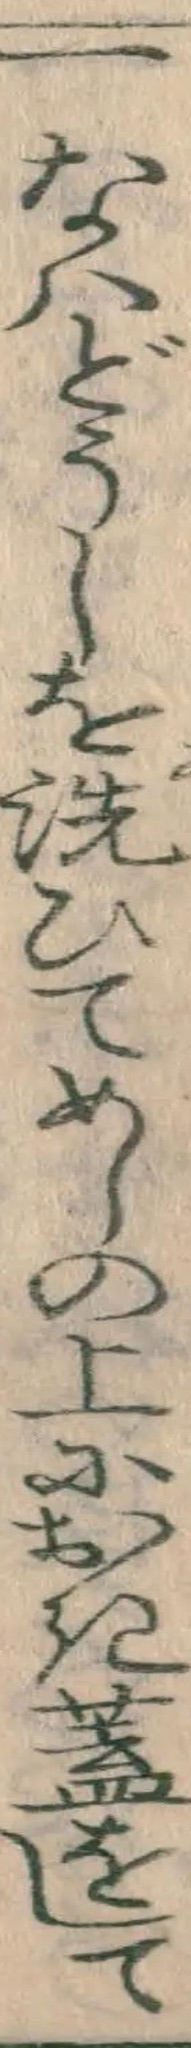一なはどうしを洗ひてめしの上におき葢をして
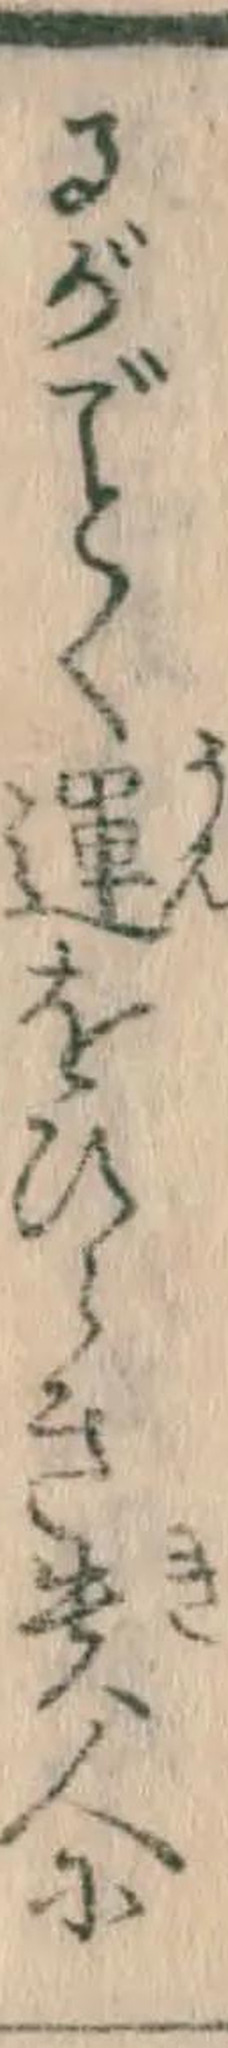るがごとく運をひらき貴人に
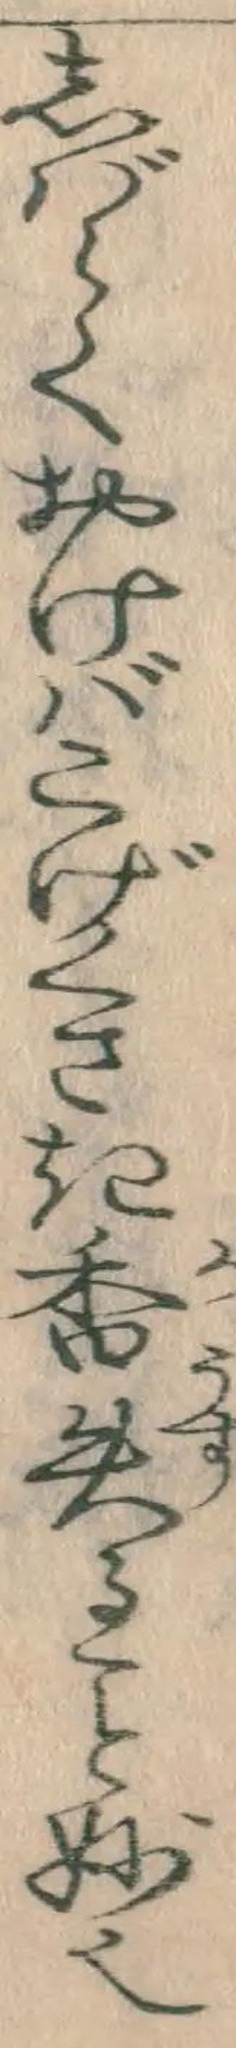しばらくおけばこげくさき香失ること妙也
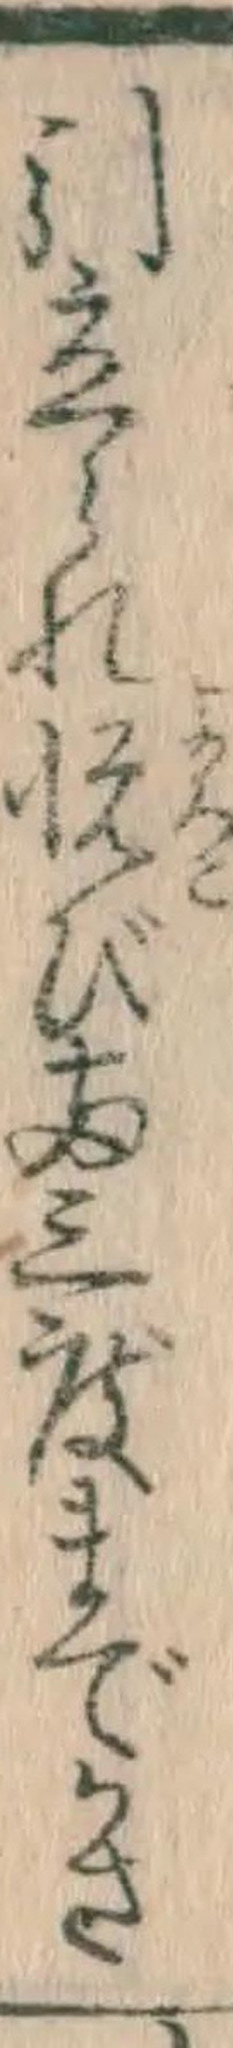引立られ悦び両三度までかさ
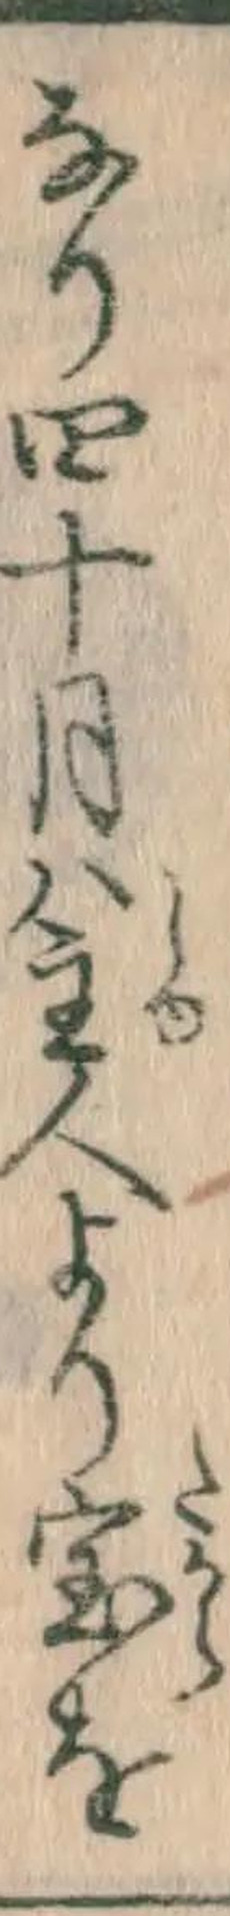なり四十月は主人より宝を
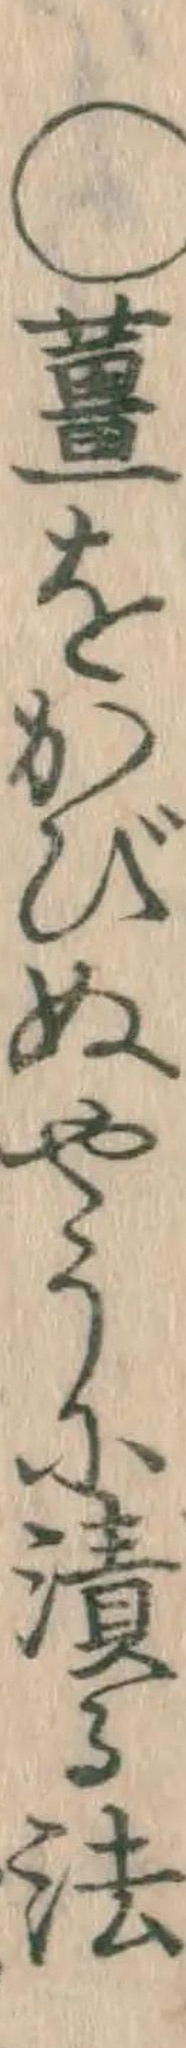○薑をかびぬやうに漬る法
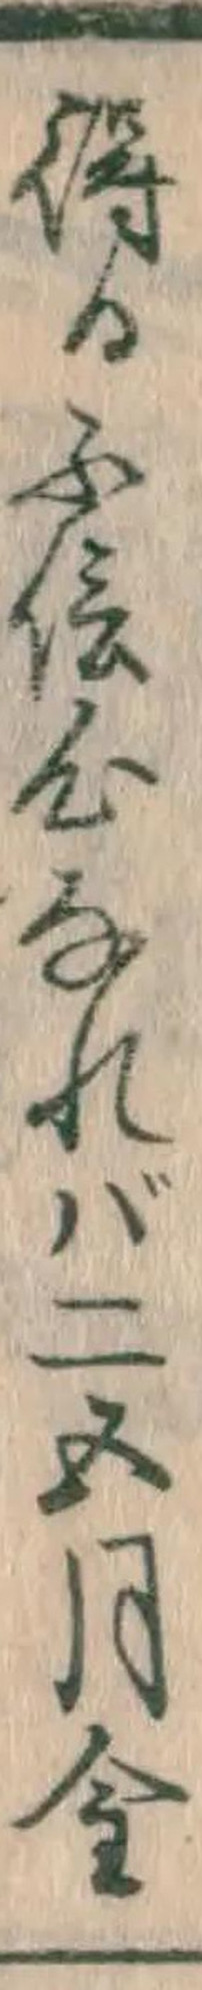得る不信心なれば二五月金
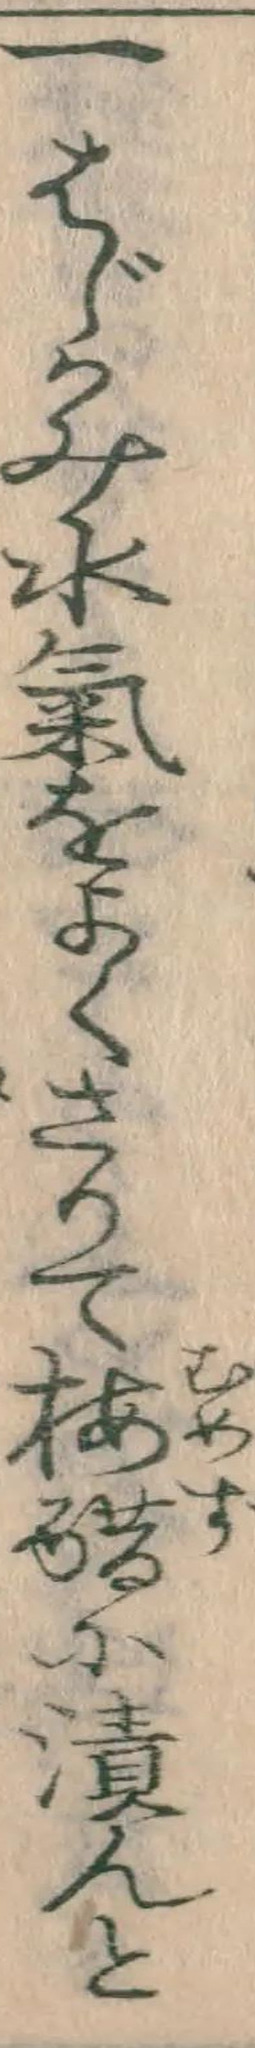一はじかみ水気をよくさりて梅醋に漬んと
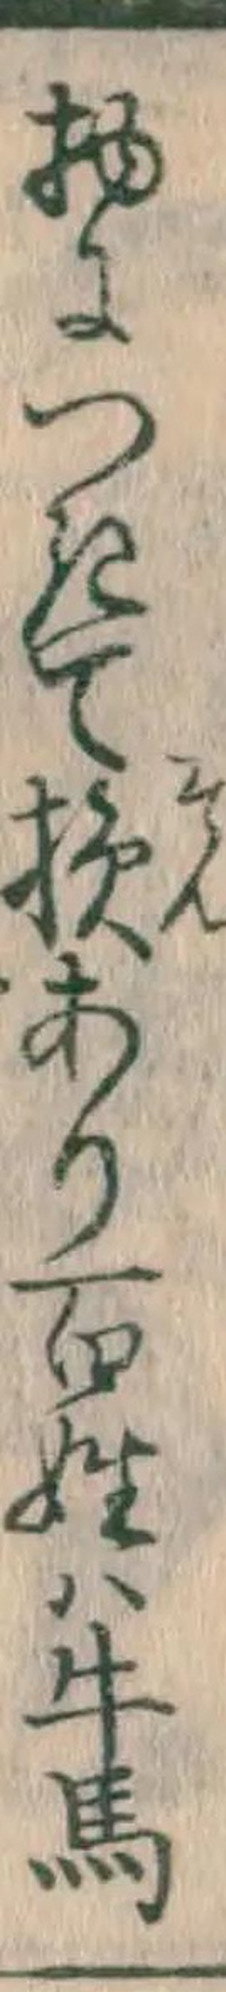物につきて損あり百姓は牛馬
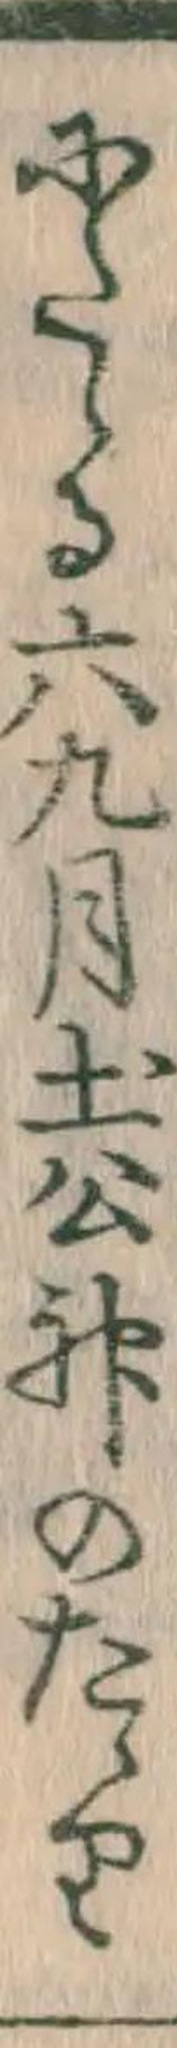にたゝる六九月土公神のたゝり
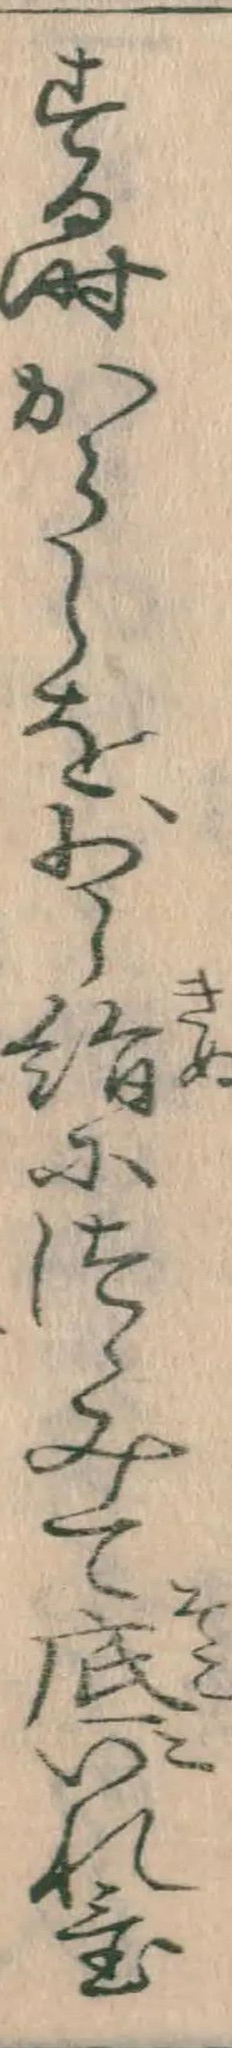する時からしを少し絹につゝみて底にいれ置
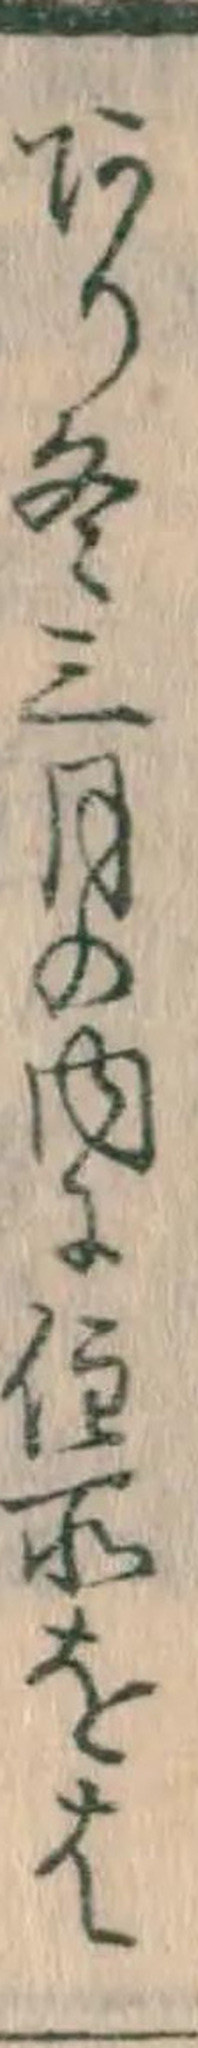あり冬三月の内に住所をは
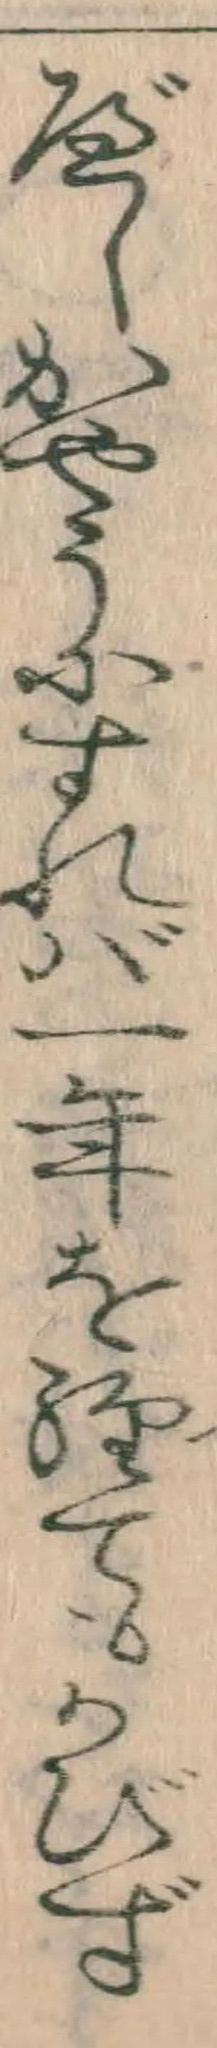べしかやうにすれば一年を経てもかびず
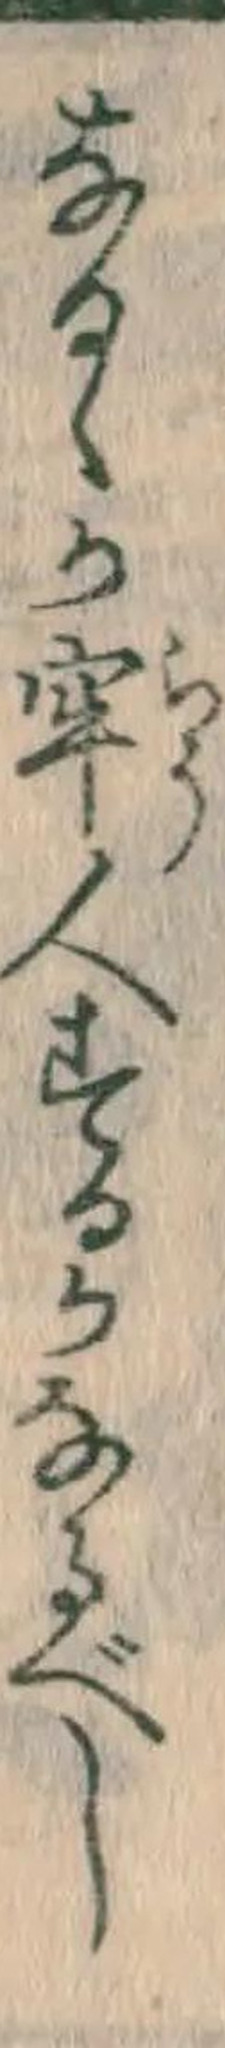なるゝか牢人するかなるべし
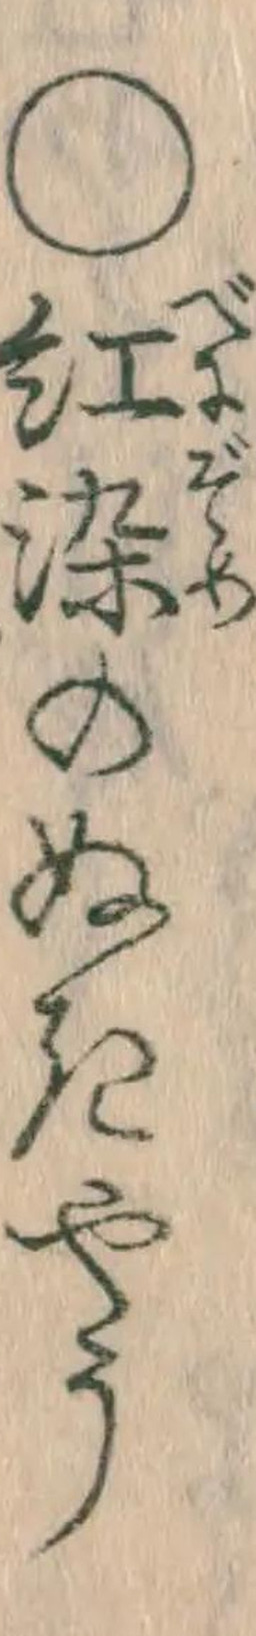○紅染のぬきやう
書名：広益秘事大全 3巻. [1]
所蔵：国立国会図書館 National Diet Library, JAPAN
